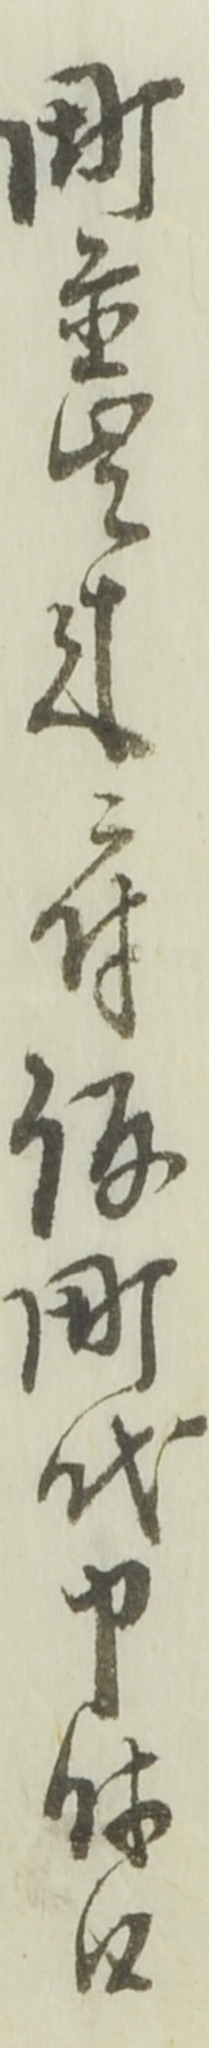町並出来ニ付仮町代申付候
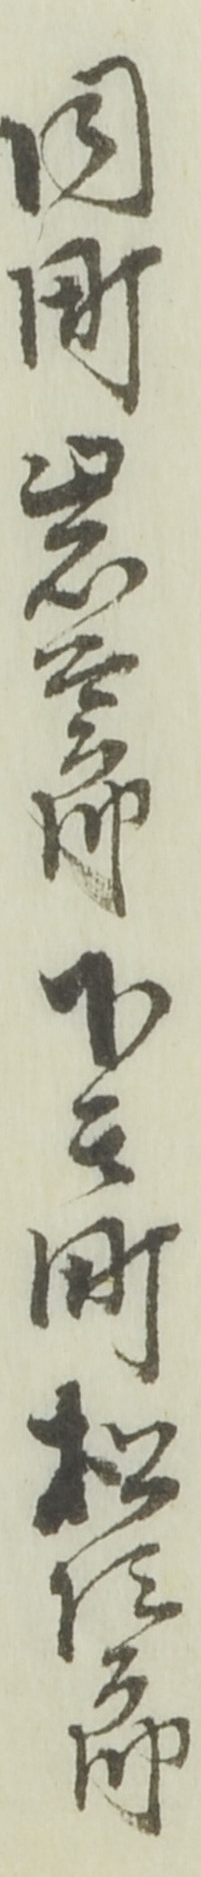同町岩太郎下モ町松次郎
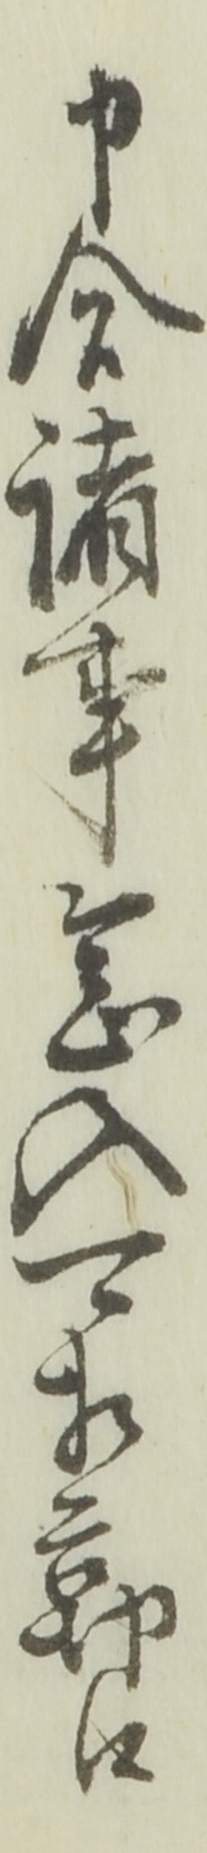申合諸事念入可相勤候
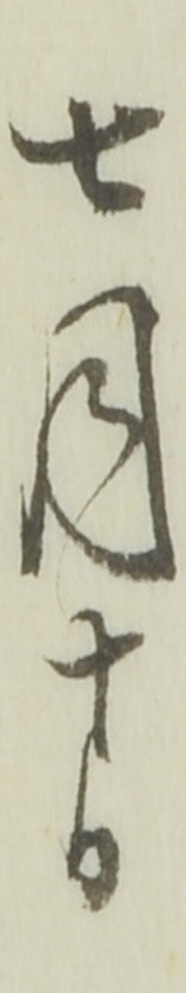七月十日
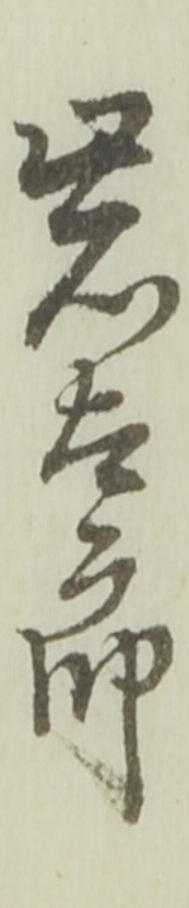岩太郎
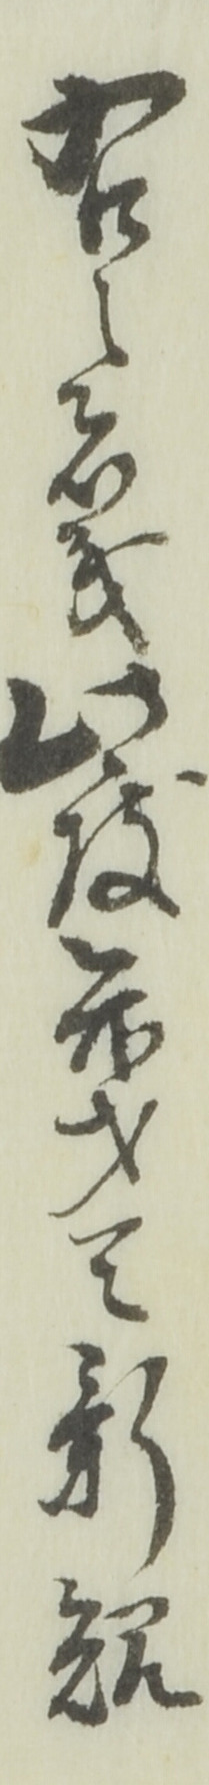右之者義此度弁財天新規
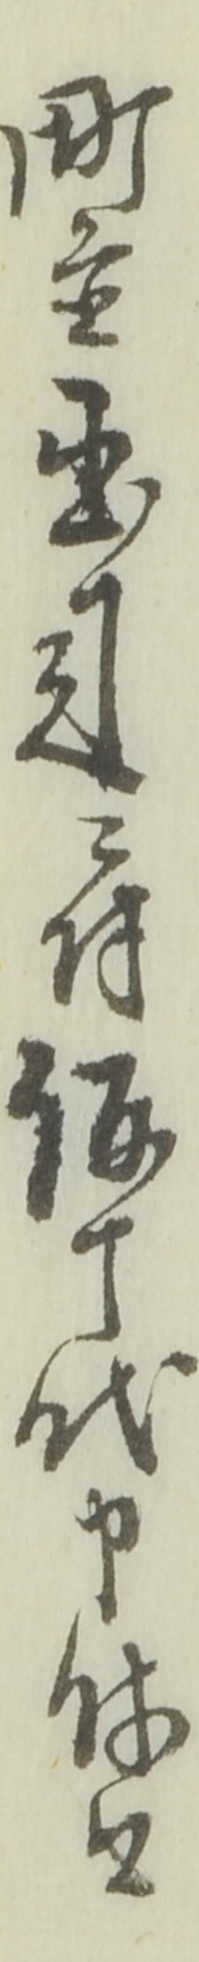町並出来ニ付仮町代申付候
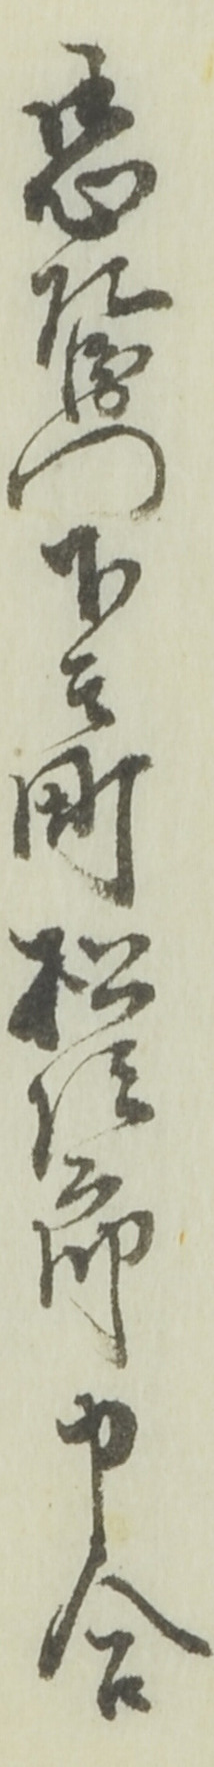忠左衛門下モ町松次郎申合
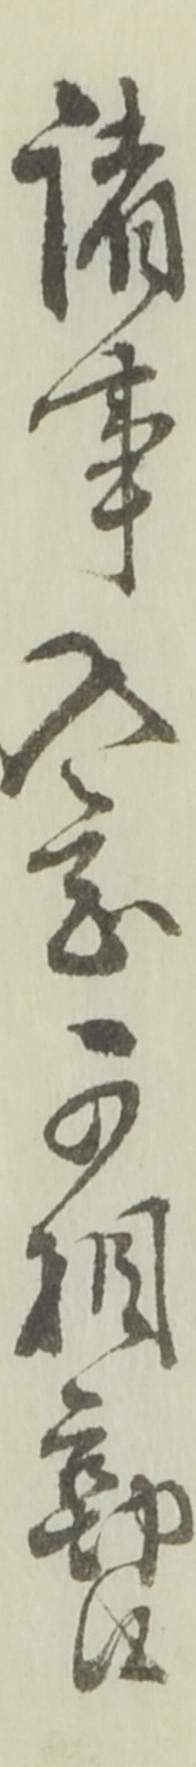諸事入念可相勤候
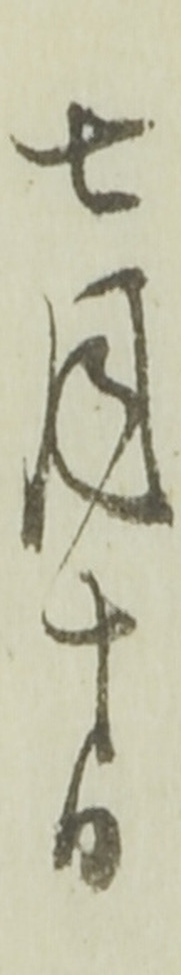七月十日
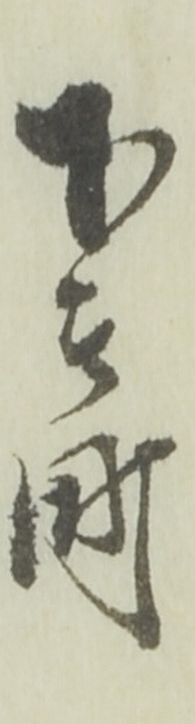下モ町
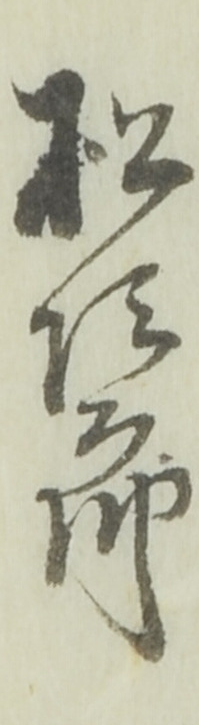松次郎
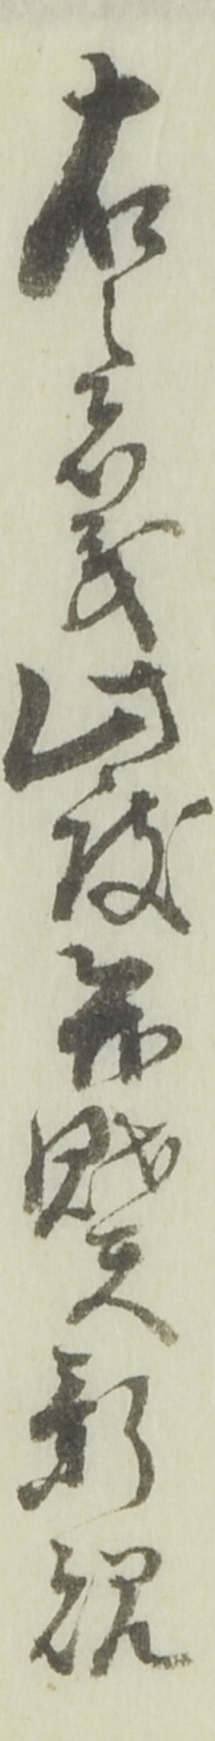右之者義此度弁財天新規
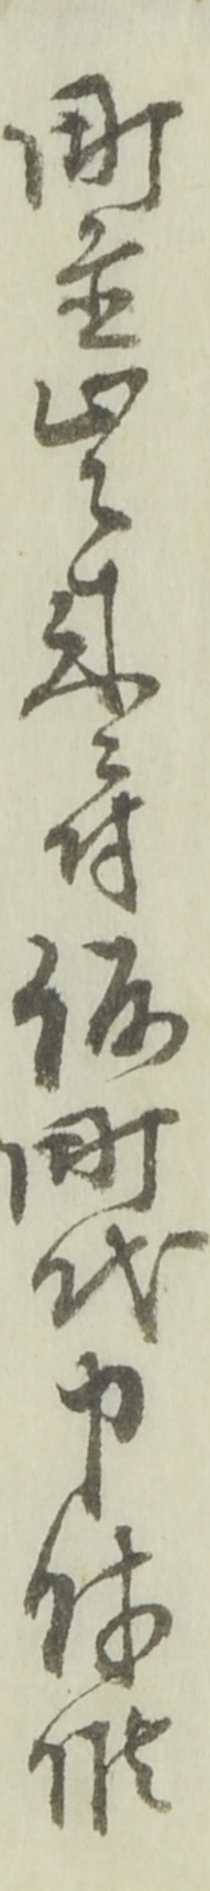町並出来ニ付仮町代申付候

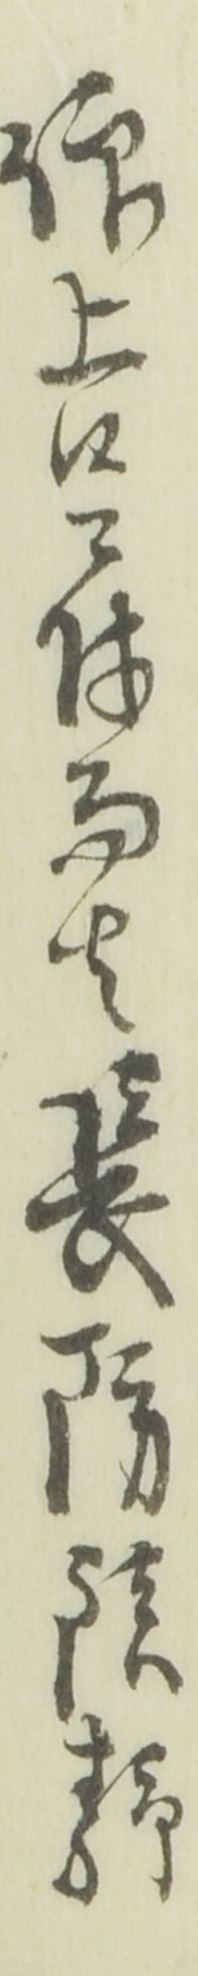仰上候ニ付而者長防鎮静
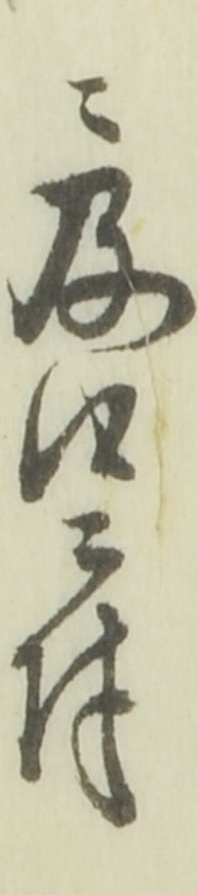ニ及候ニ付
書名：御触書御書附控帳
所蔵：伊那市立高遠町図書館・合同会社AMANE
